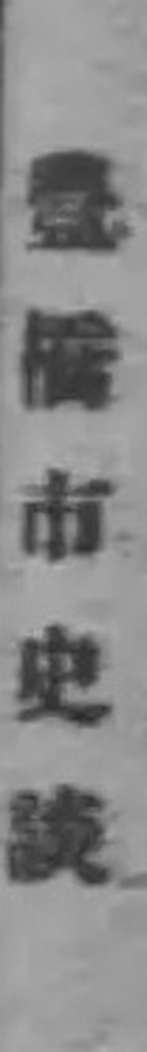豊橋市史談
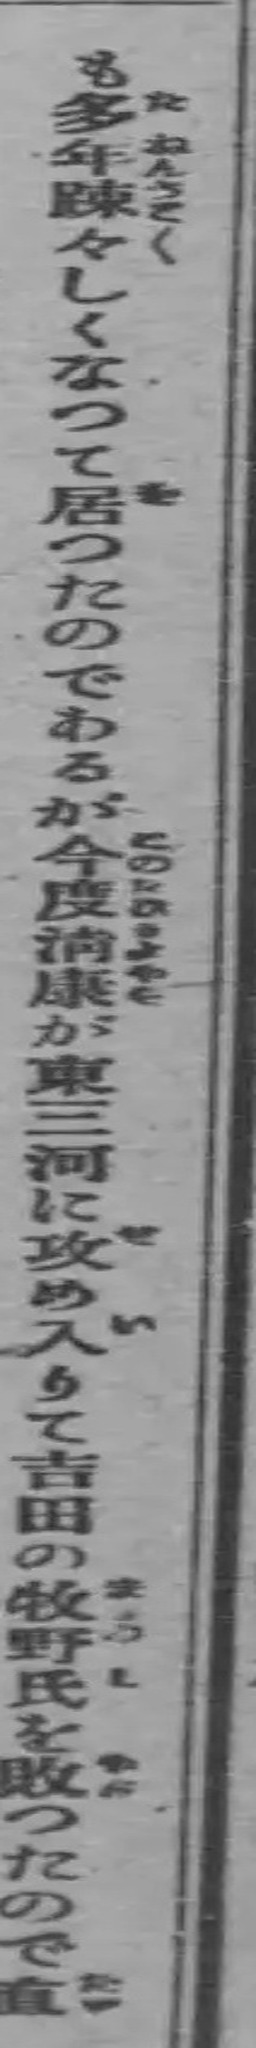も多年疎々しくなつて居つたのであるが今度清康が東三河に攻め入りて吉田の牧野氏を敗つたので直
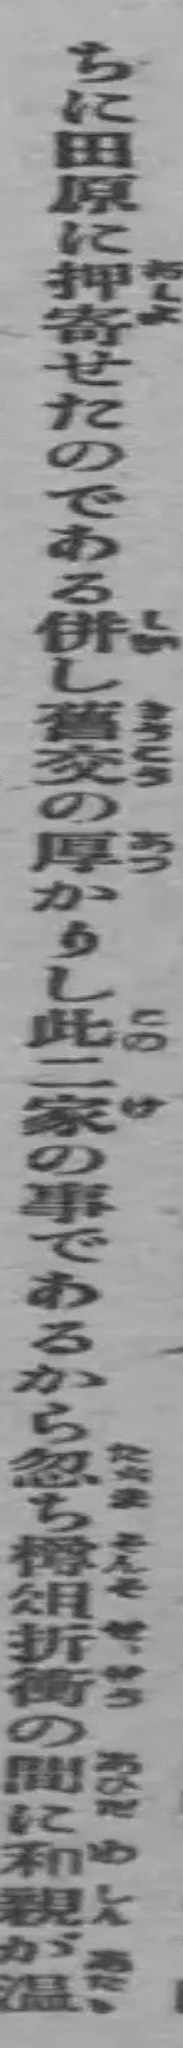ちに田原に押寄せたのである併し旧交の厚かりし此二家の事であるから忽ち樽俎折衝の間に和親が温
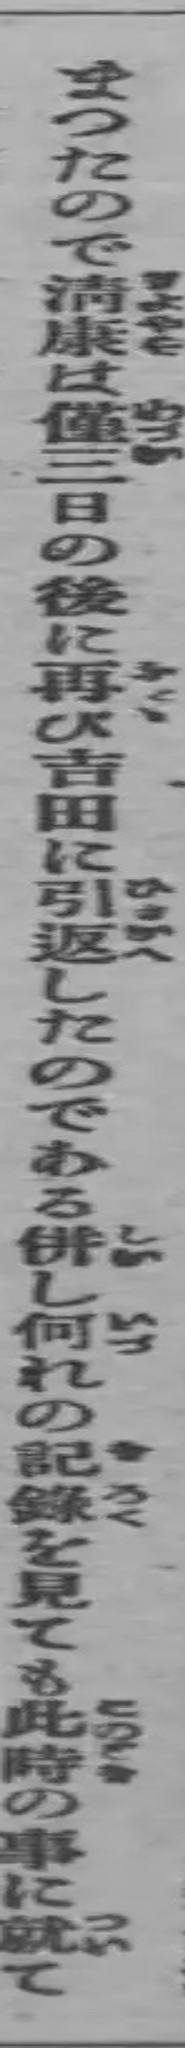まつたので清康は僅三日の後に再び吉田に引返したのである併し何れの記録を見ても此時の事に就て
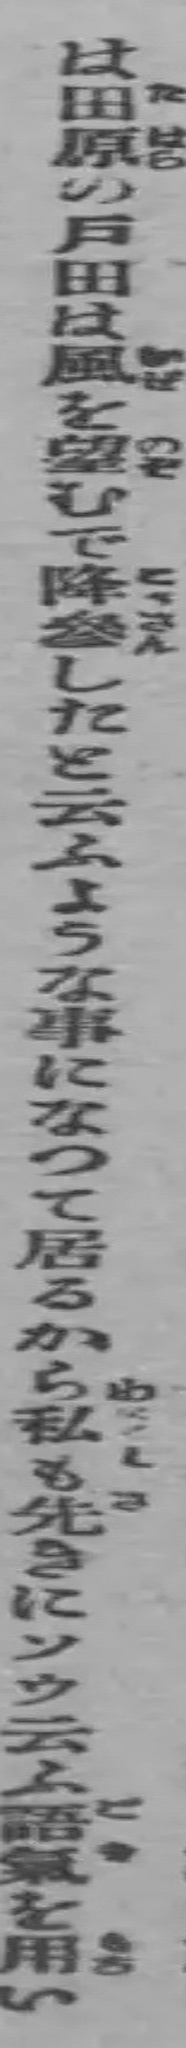は田原の戸田は風を望むで降参したと云ふような事になつて居るから私も先きにソウ云ふ語気を用い
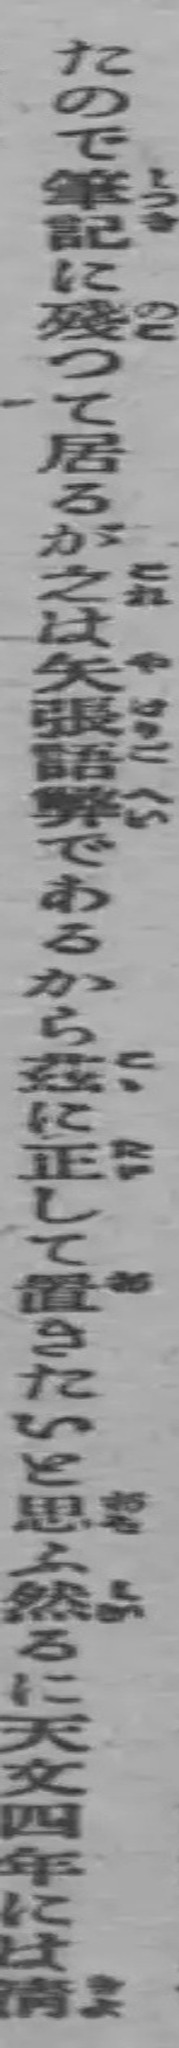たので筆記に残つて居るが之は矢張語弊であるから茲に正して置きたいと思ふ然るに天文四年には清
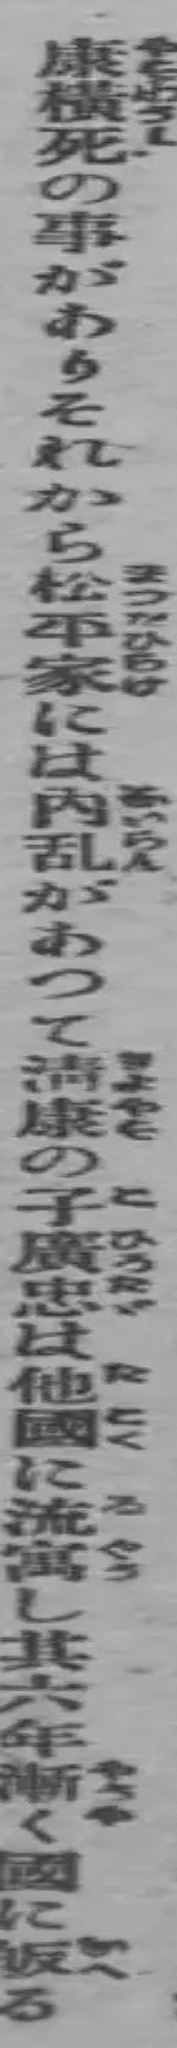康横死の事がありそれから松平家には内乱があつて清康の子広忠は他国に流寓し其六年漸く国に皈る
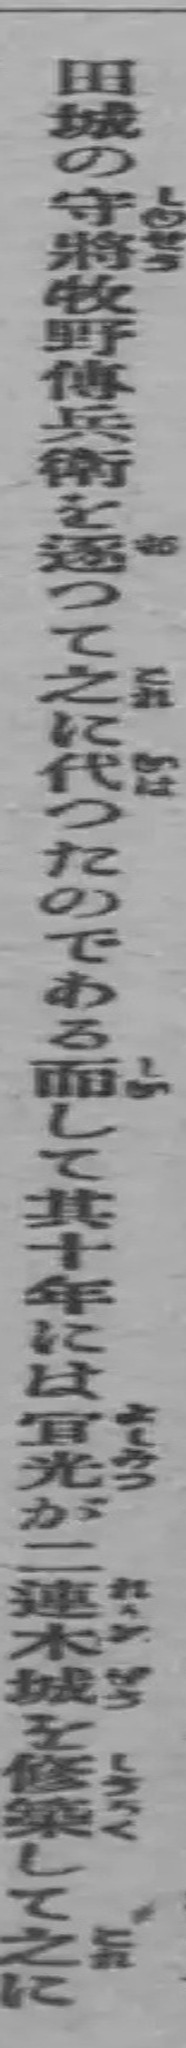に拠る田城の守将牧野傳兵衛を遂つて之に代つたのである而して其十年には冝光が二連木城を修築して之に
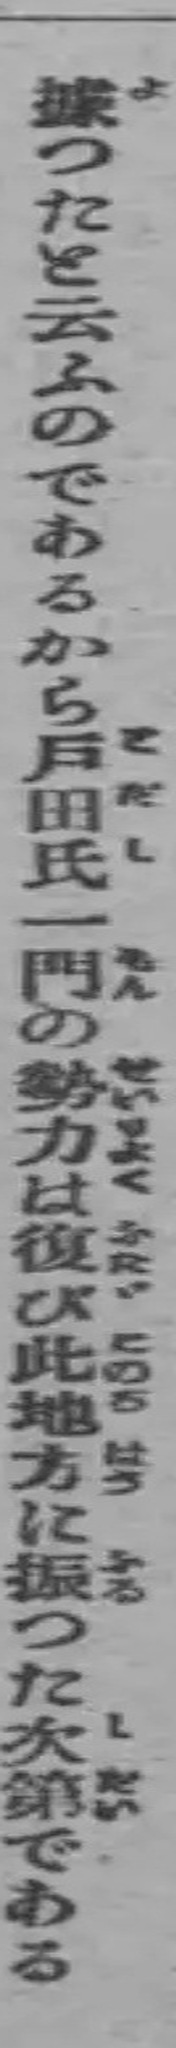拠つたと云ふのであるから戸田氏一門の勢力は復び此地方に振つた次第である
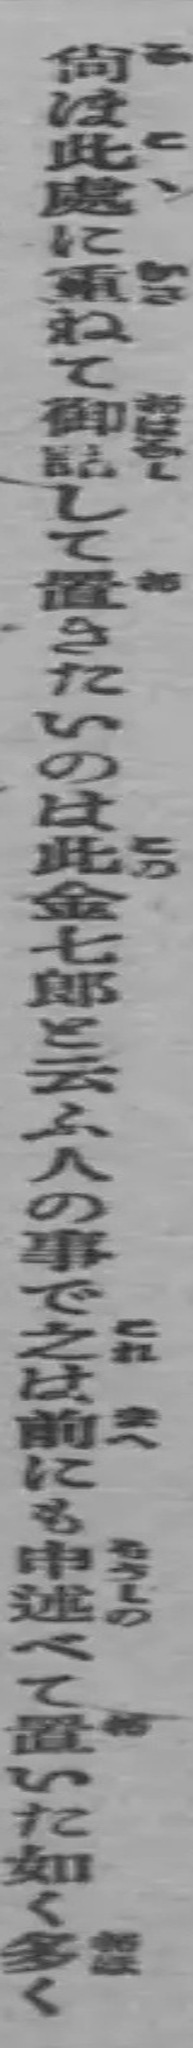尚ほ此処に重ねて御話して置きたいのは此金七郎と云ふ人の事で之は前にも申述べて置いた如く多く
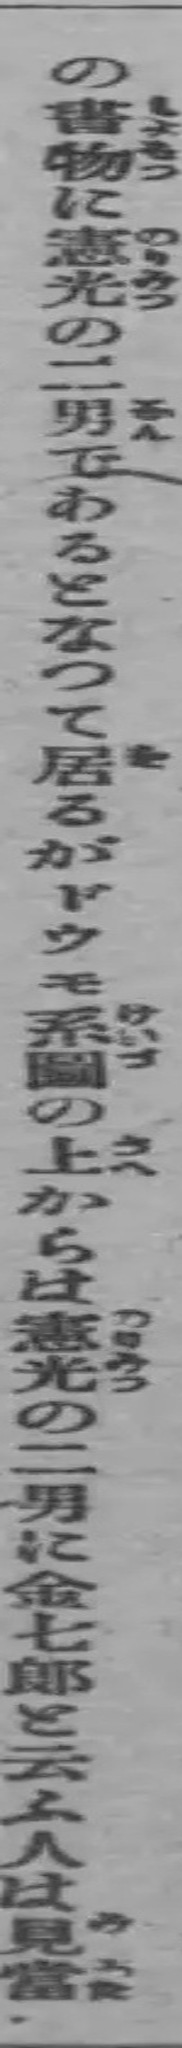の書物に憲光の二男であるとなつて居るがドウモ系図の上からは憲光の二男に金七郎と云ふ人は見当
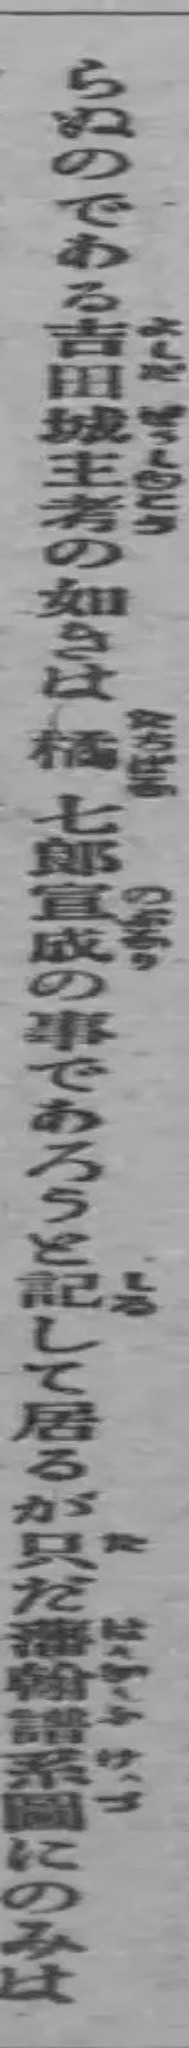らぬのである吉田城主考の如きは橘七郎宣成の事であろうと記して居るが只だ藩翰譜系図にのみは
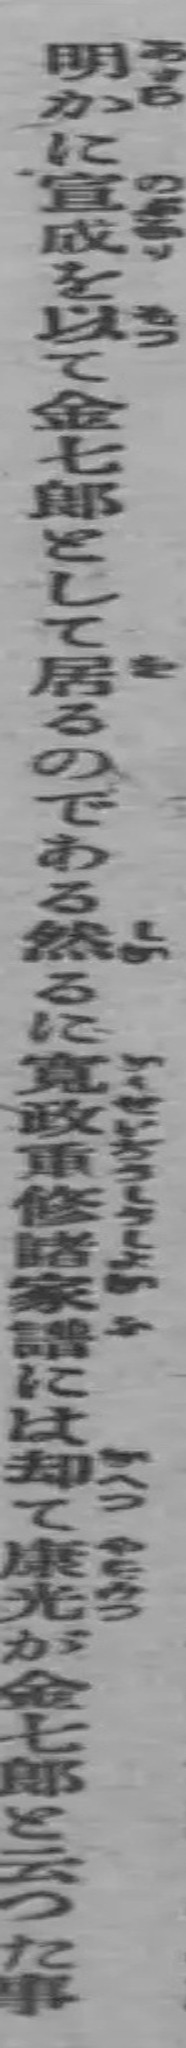明かに宣成を以て金七郎として居るのである然るに寛政重修諸家譜には却て康光が金七郎と云つた事
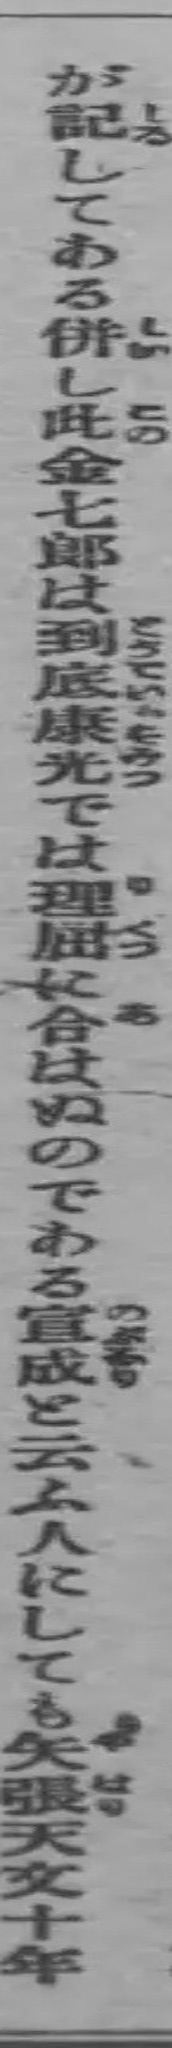が記してある併し此金七郎は到底康光では理屈に合はぬのである宣成と云ふ人にしても矢張天文十年
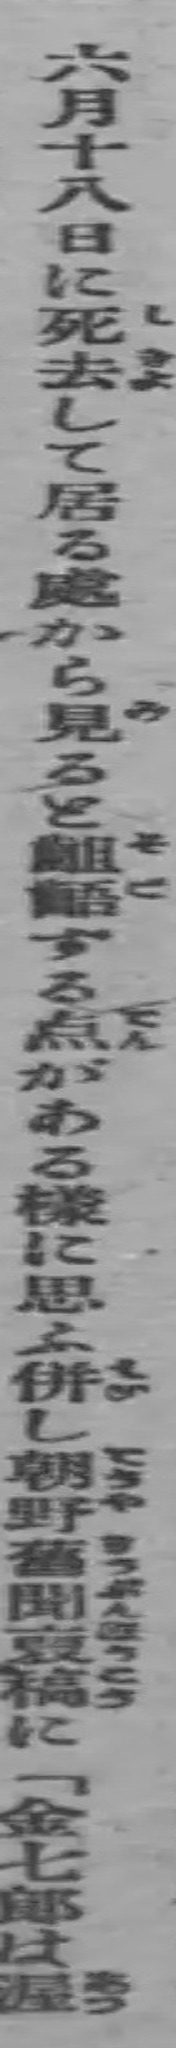六月十八日に死去して居る処から見ると齟齬する点がある様に思ふ併し朝野旧聞裒稿に「金七郎は渥
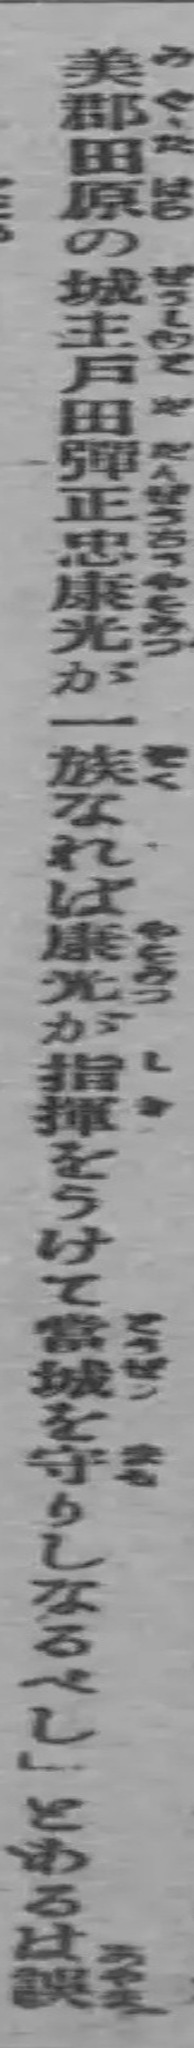美郡田原の城主戸田弾正忠康光が一族なれば康光が指揮をうけて当城を守りしなるべし」とあるは誤
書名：豊橋市史談
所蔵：国立国会図書館 National Diet Library, JAPAN
